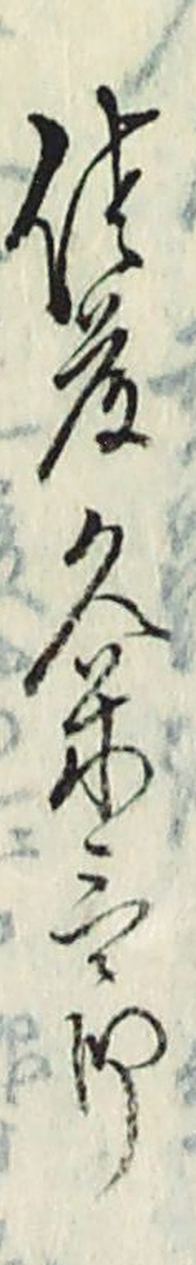佐藤久米三郎
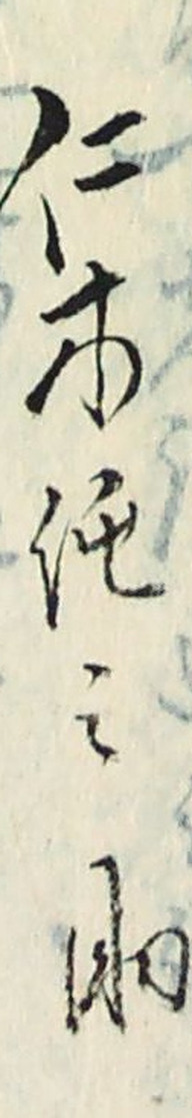仁木純之助
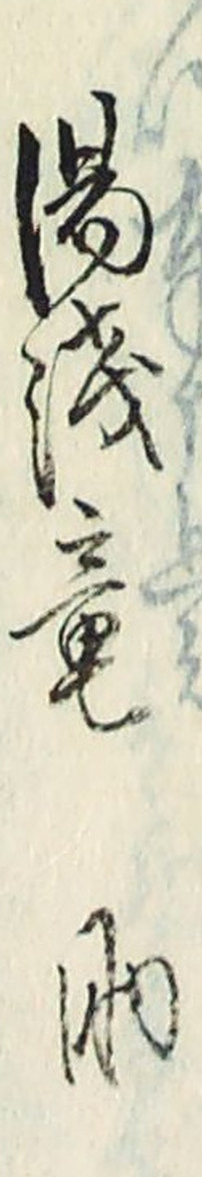湯浅竜助
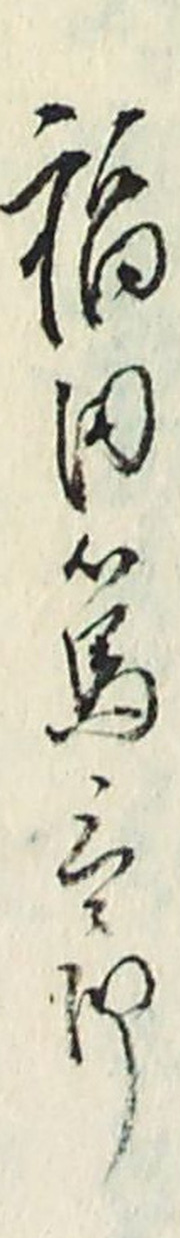福田篤三郎
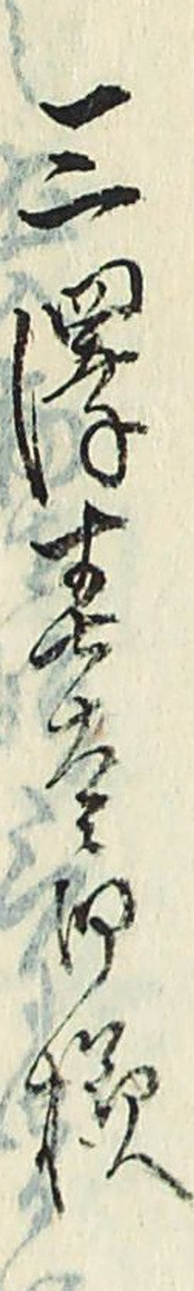三澤春太郎様
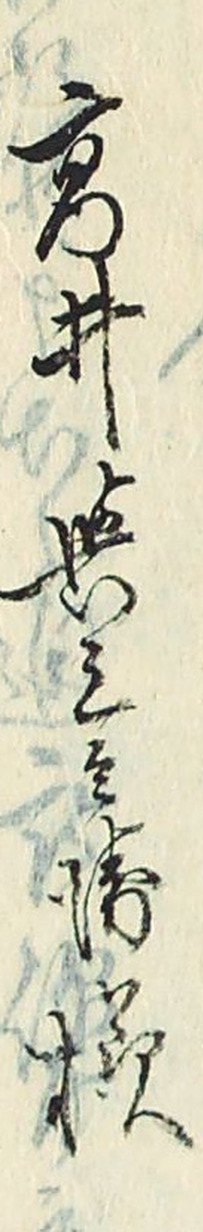高井與三兵衛様
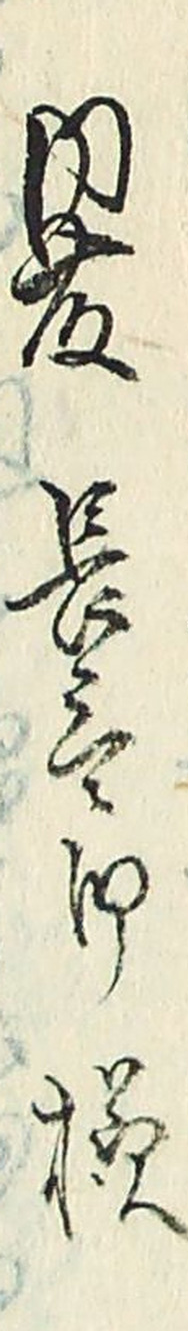内藤長三郎様
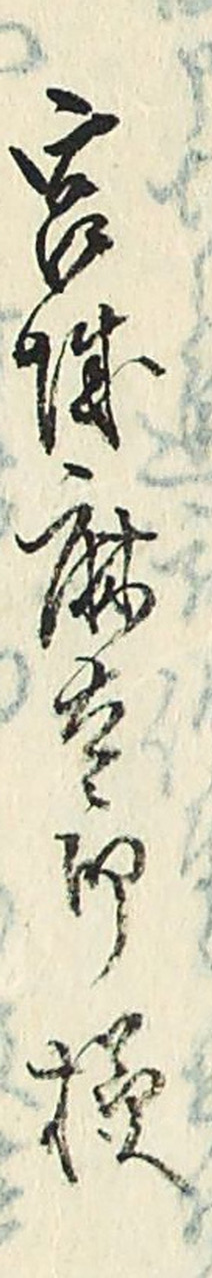宮城麻太郎様

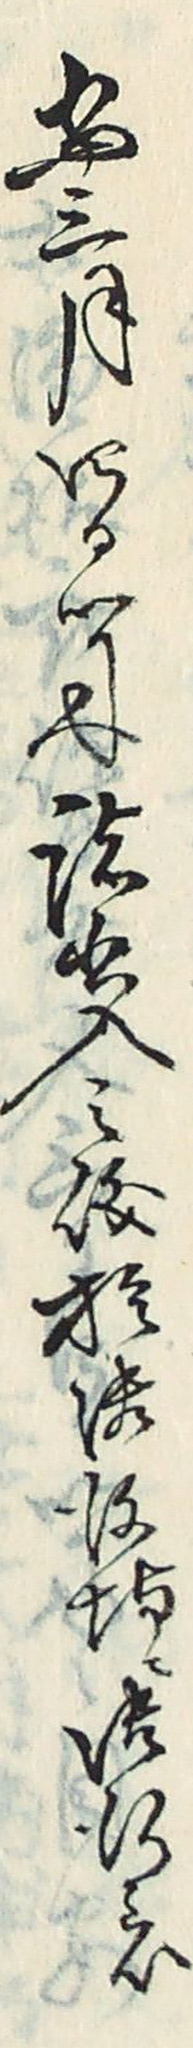當三月四日以来諸出入之儀於御役場ニ御行着
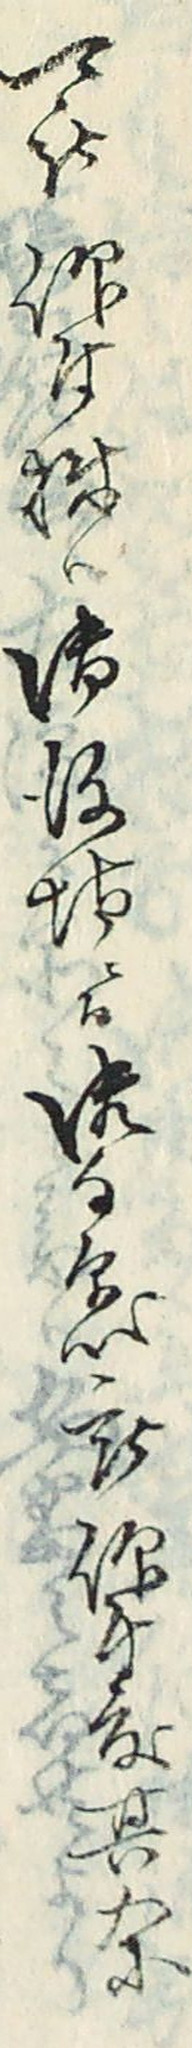可被仰付株ハ御役場ニ而御手懸被仰付度其余
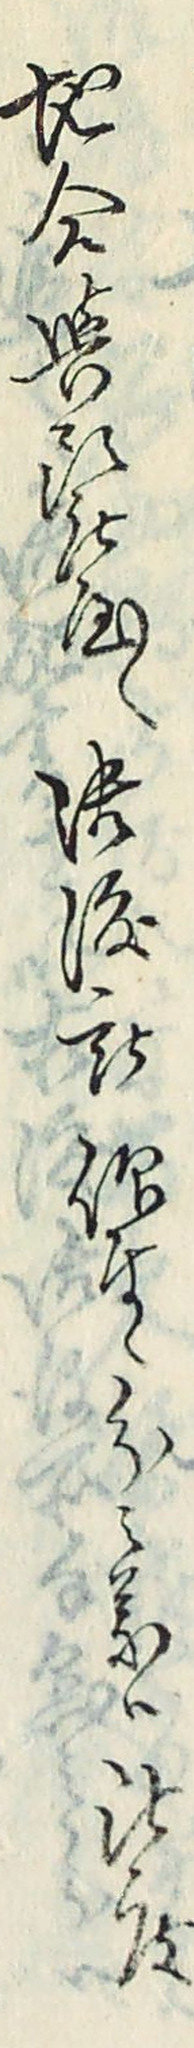地合與頭庄屋へ御渡被仰付候分之義ハ此度
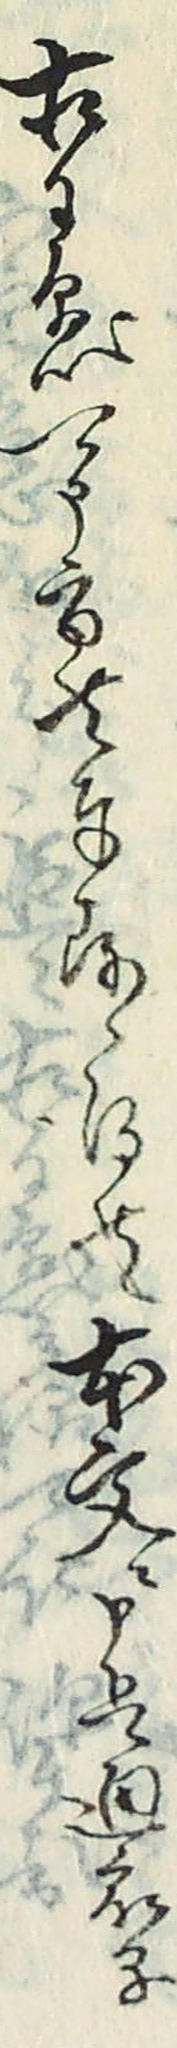相手懸可申方共奉存候得共本文ニ申上候通最早
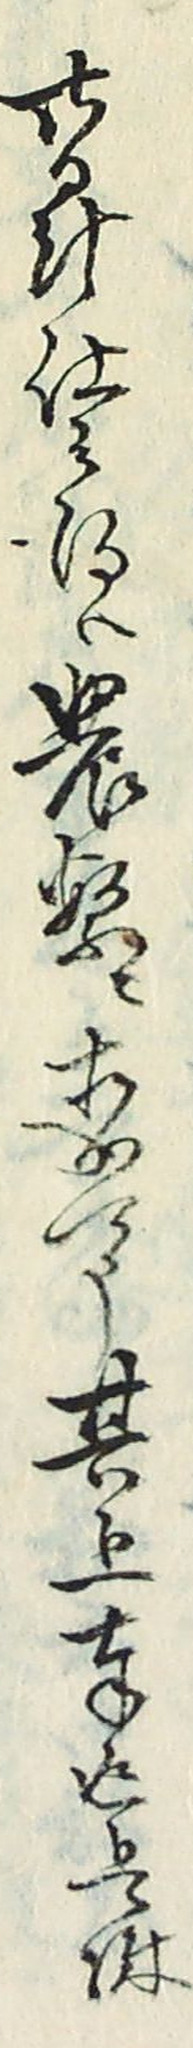廿日計仕候得ハ農繁ニ相成可申其上奉返上候株
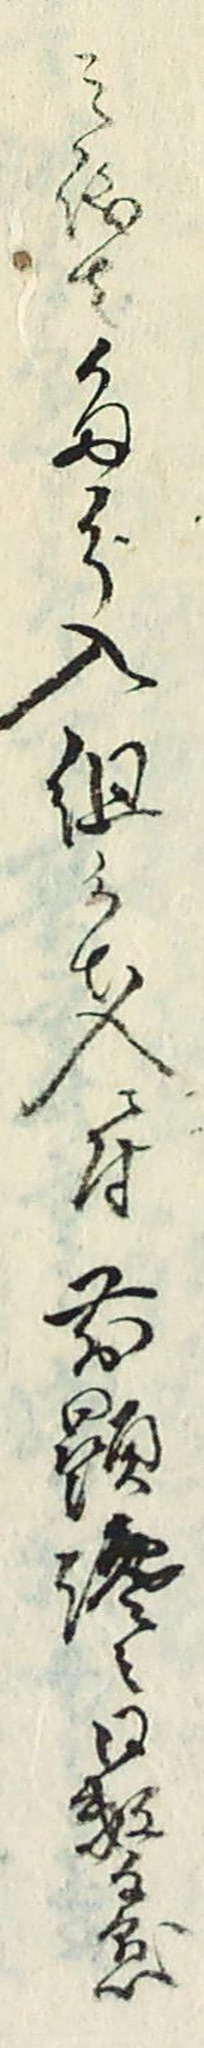之儀者多分入組候出入ニ付前顕讒之日数手懸
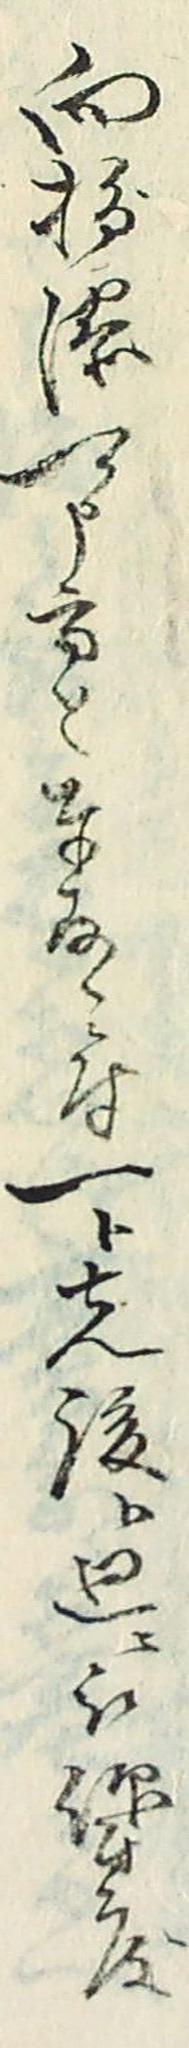向指湊可申方と奉存候ニ付一ト先後ㇳ廻ニ被仰付度
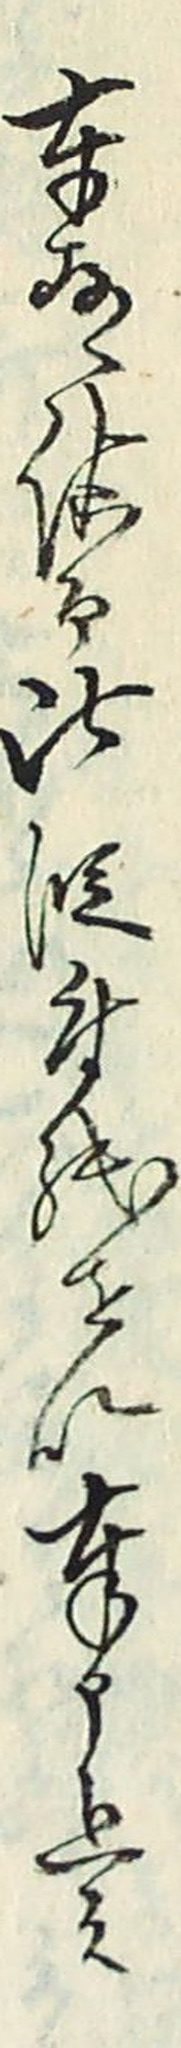奉存候依而此段付紙を以奉申上候
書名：諸御趣意書并御下知向之写
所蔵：鳴門教育大学 Naruto University of Education
